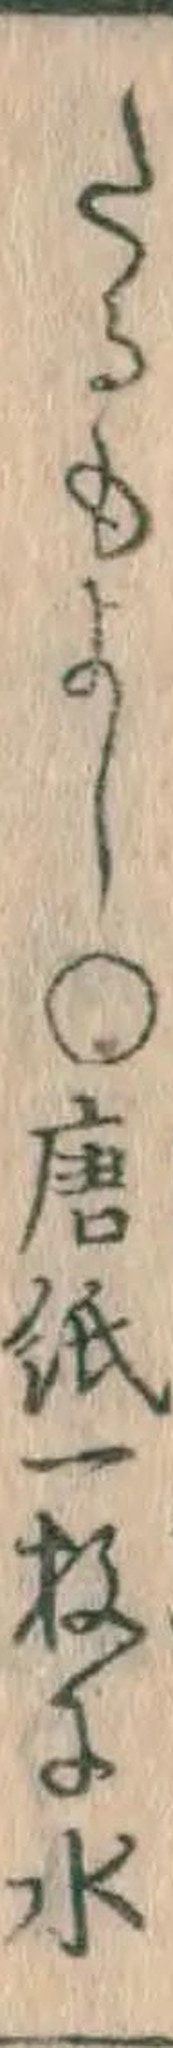たるもよし○唐紙一枚に水
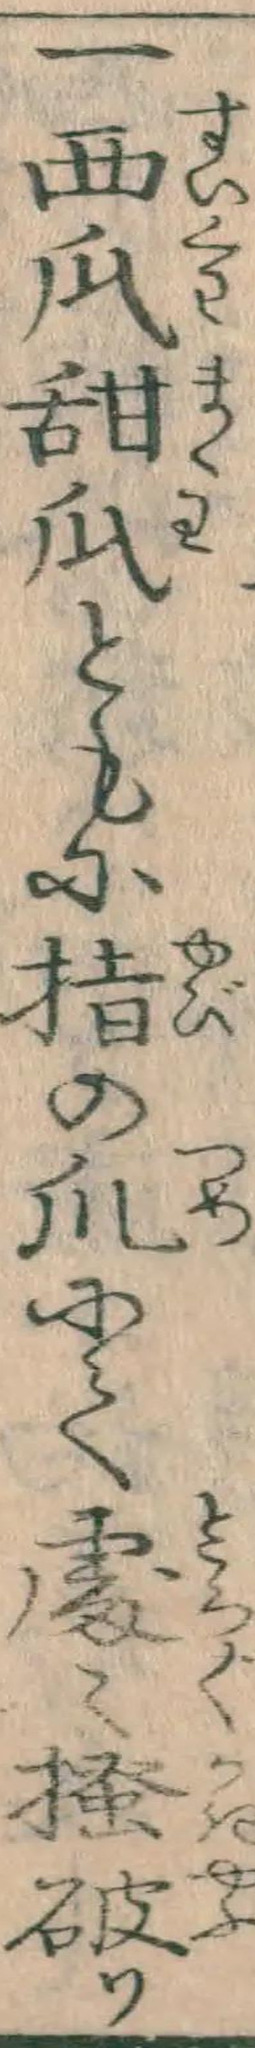一西瓜甜瓜ともに指の爪にて処々掻破り
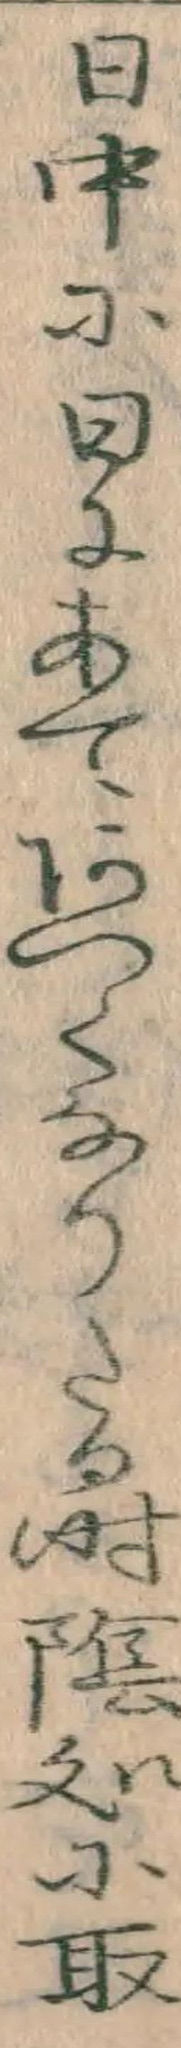日中に日にあてあつくなりたる時陰処に取
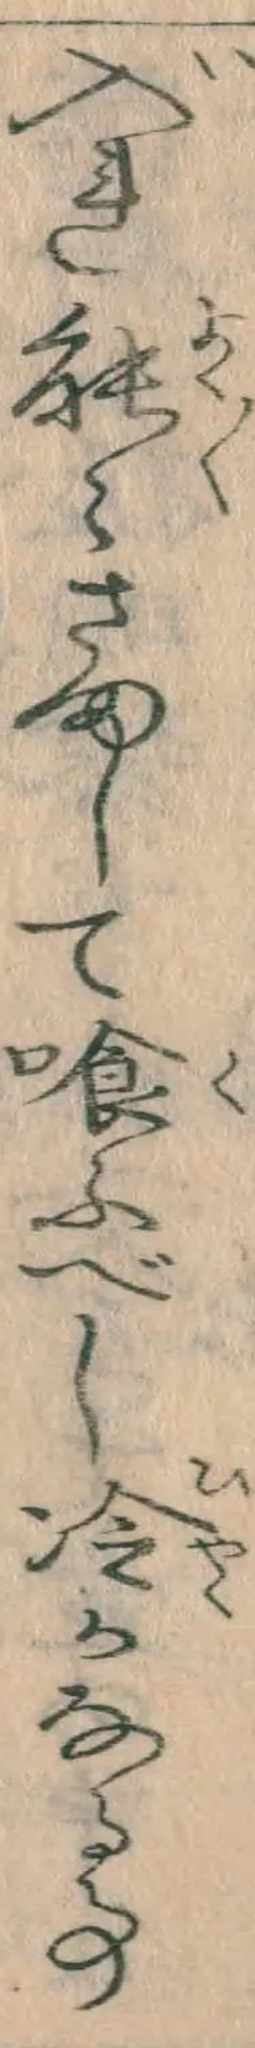入れ能々さまして喰ふべし冷かなる事
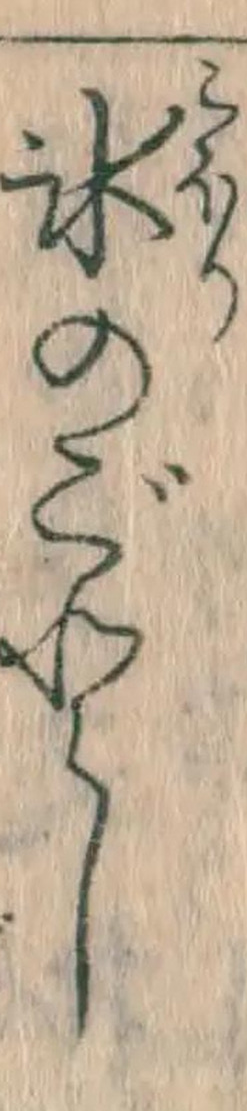氷のごとし
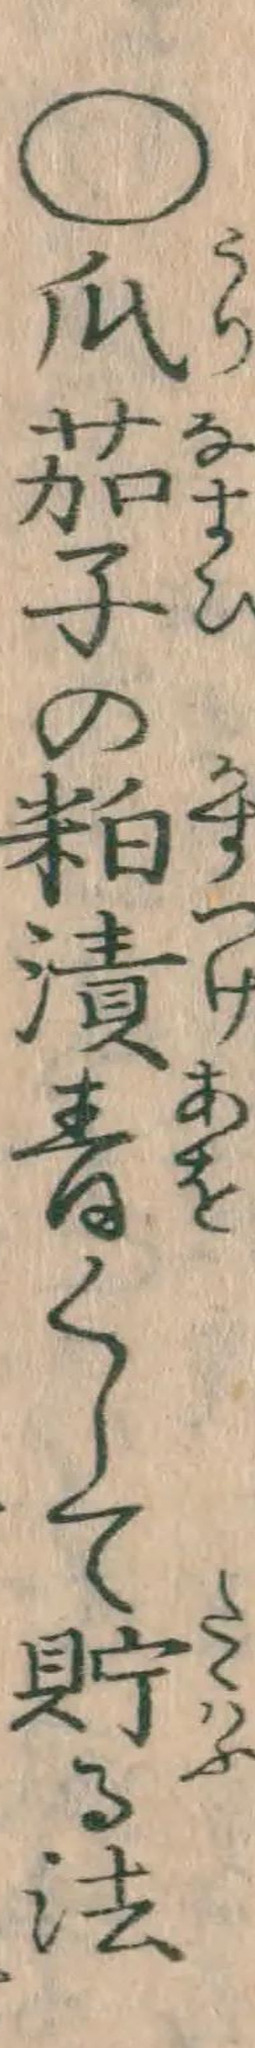○瓜茄子の粕漬青くして貯る法
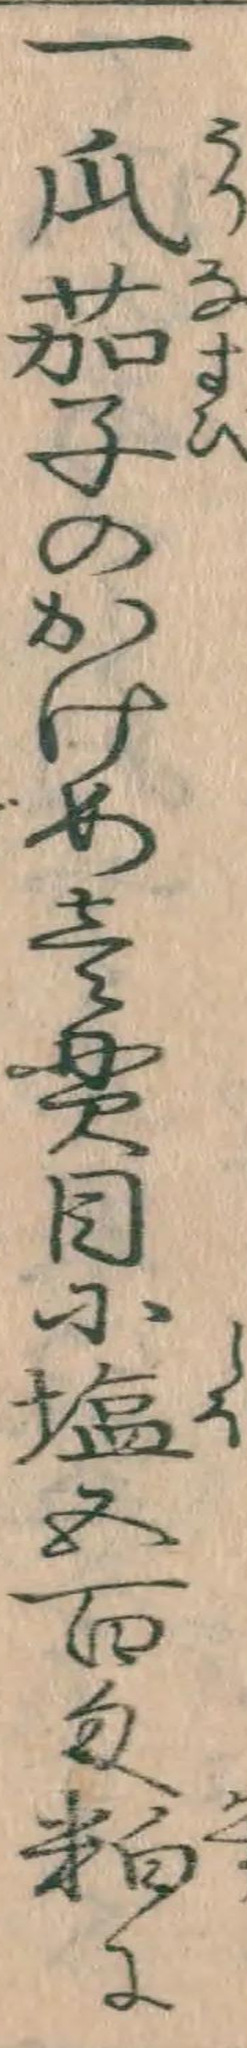一瓜茄子のかけめ壱貫目に塩五百匁粕に
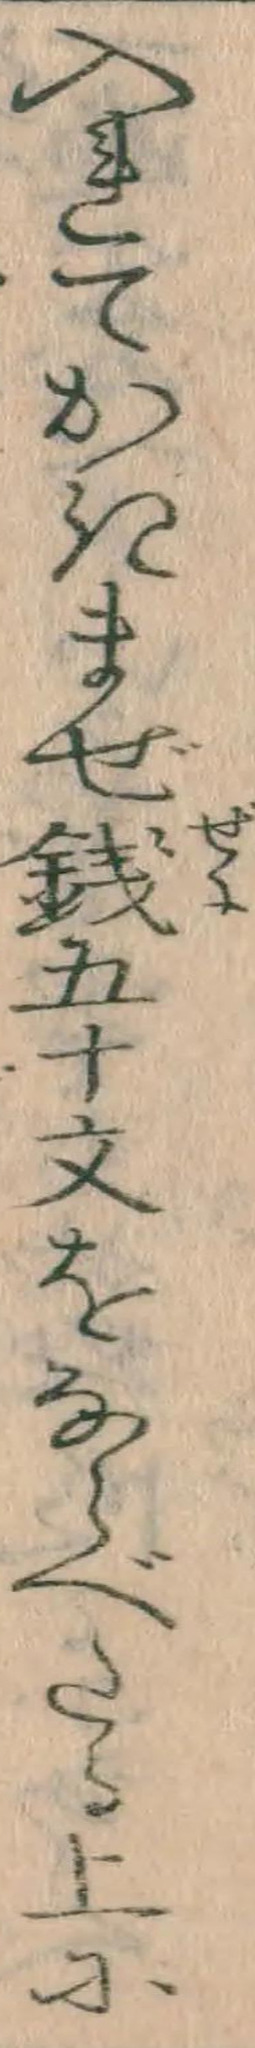入れてかきまぜ銭五十文をならべたる上に
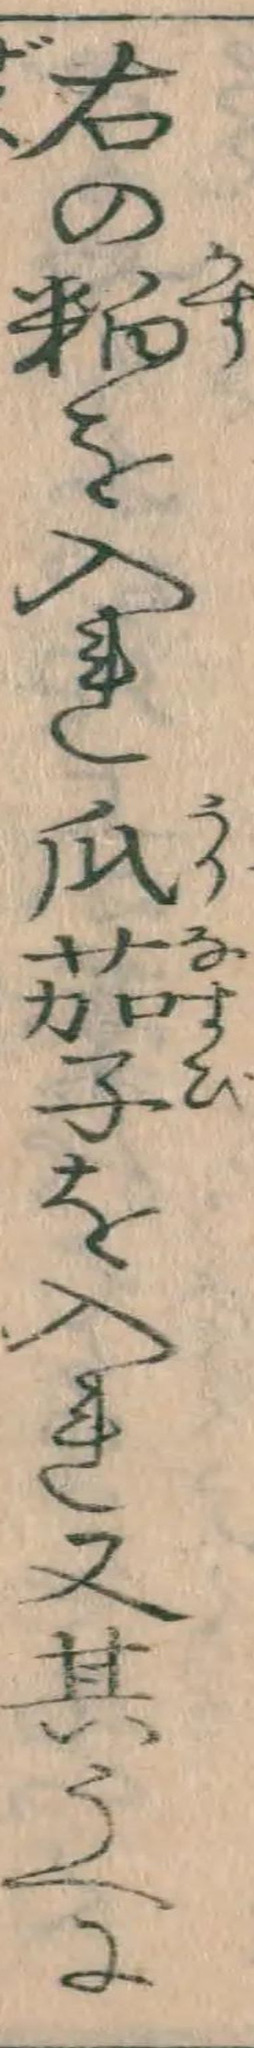右の粕を入れ瓜茄子を入れ又其うへに
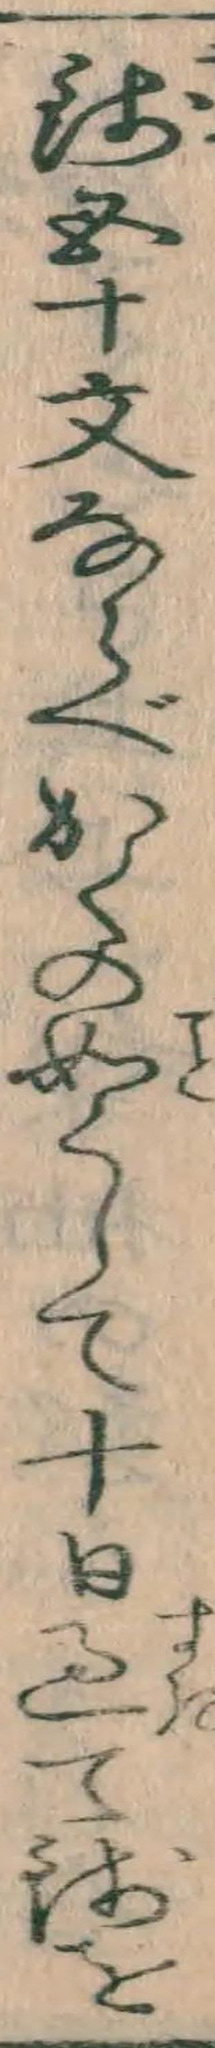銭五十文ならべかくの如くして十日過て銭を
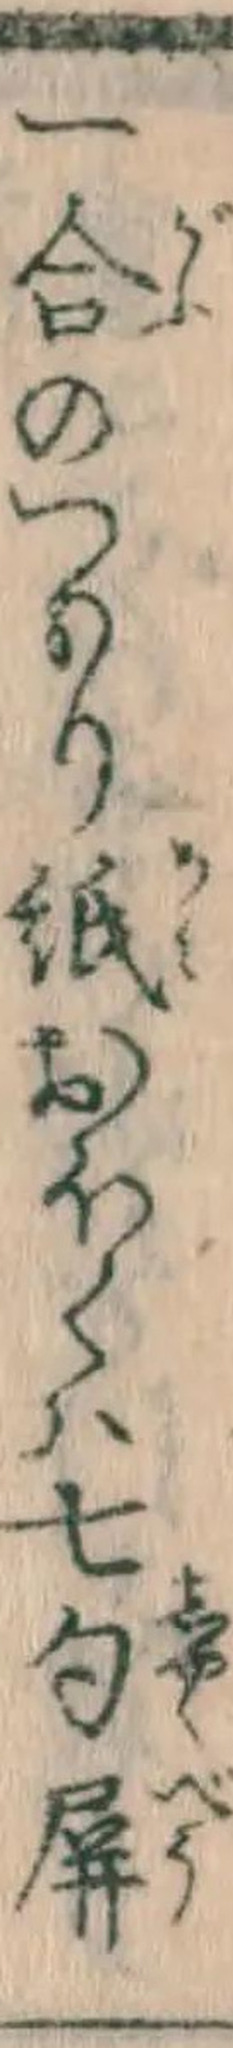一合のつもり紙おほくは七勺屏
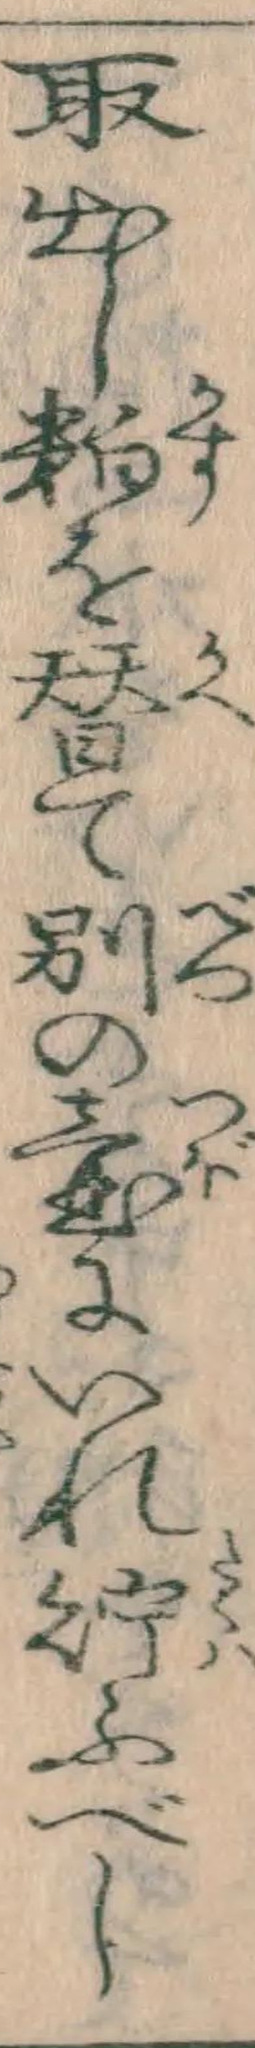取出し粕を替て別の壺にいれ貯ふべし
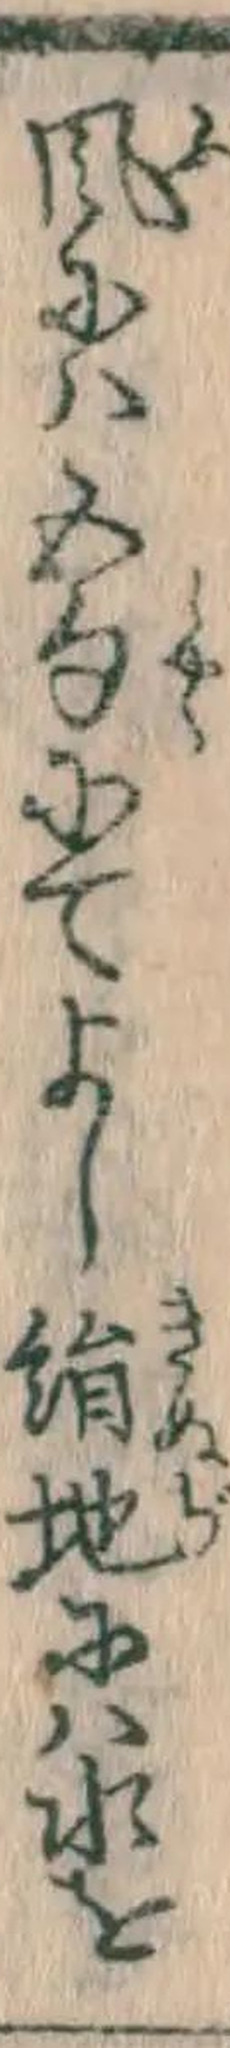風には五勺にてよし絹地には水を
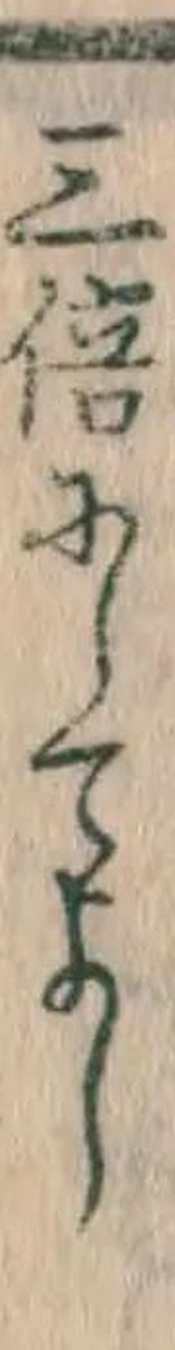三倍にしてよし
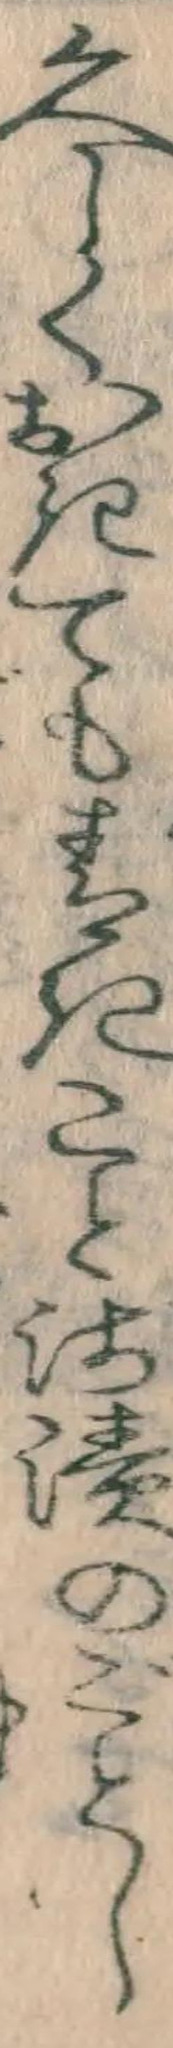久しくおきても青きこと浅漬のごとし
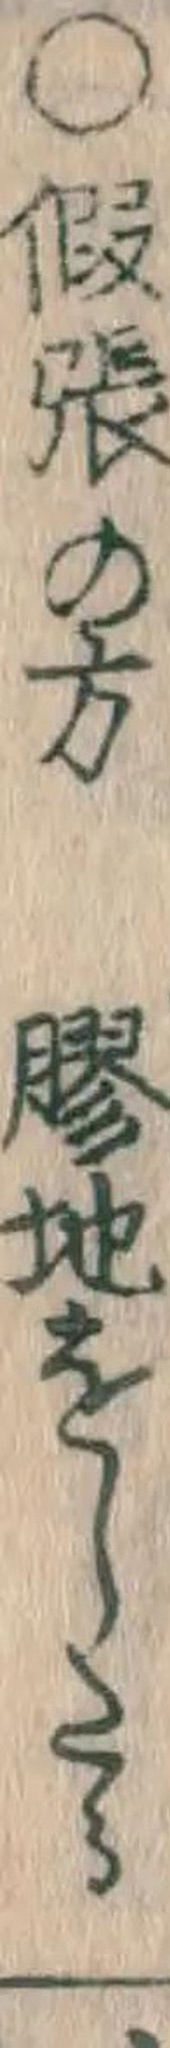○假張の方膠地をしたる
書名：広益秘事大全 3巻. [2]
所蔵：国立国会図書館 National Diet Library, JAPAN
